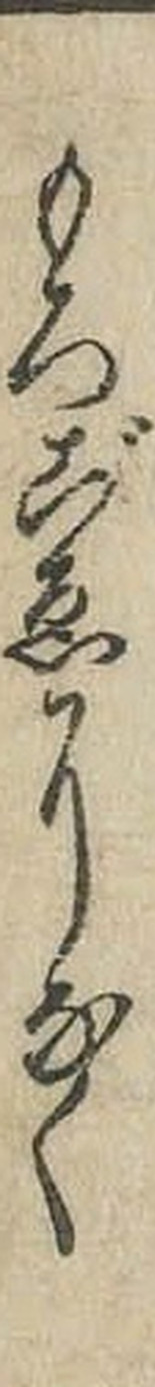もろごゑになく

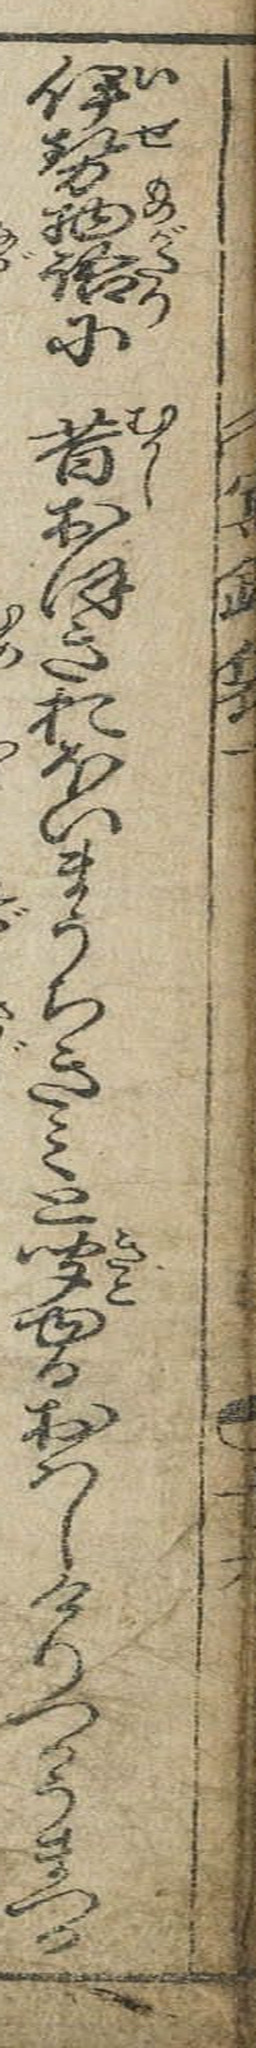伊勢物語に昔おほきおほいまうちきみと聞ゆるおはしけりつかうまつる
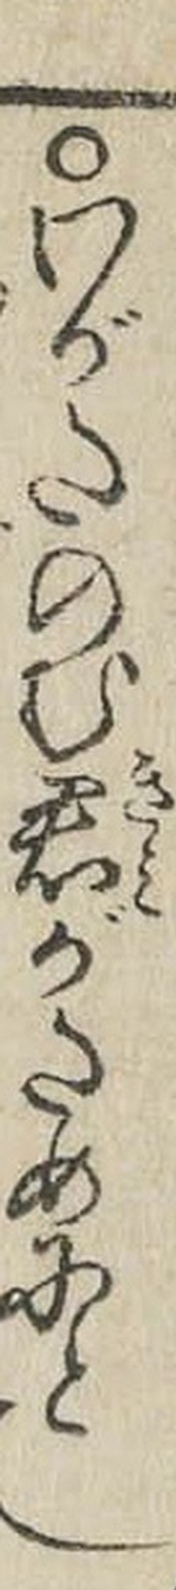◦わがたのむ君がためにと
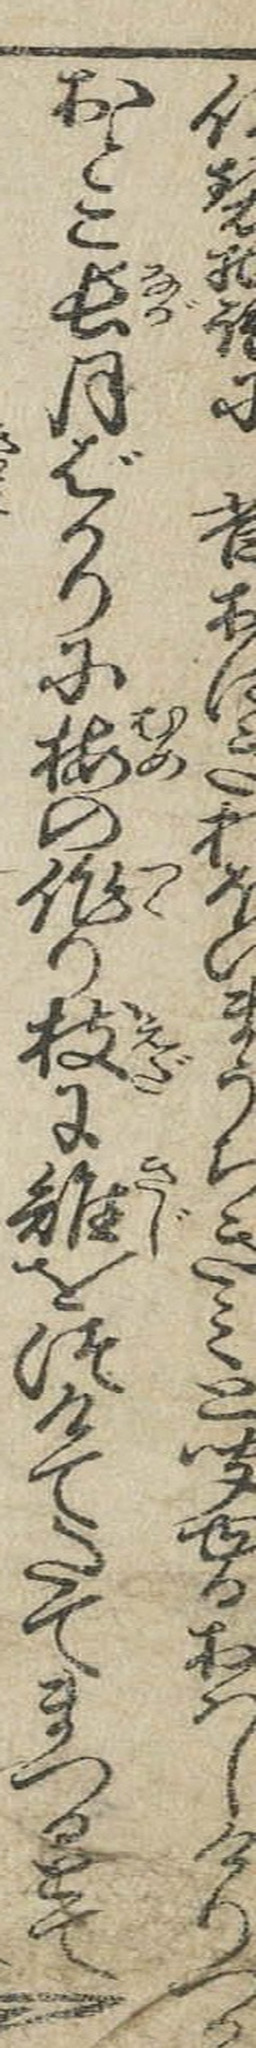おとこ長月ばかりに梅の作り枝に雉をつけてたてまつるとて
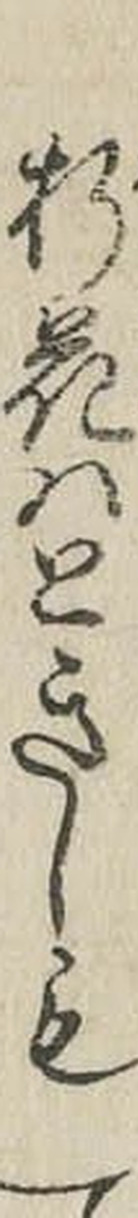折花はときしも
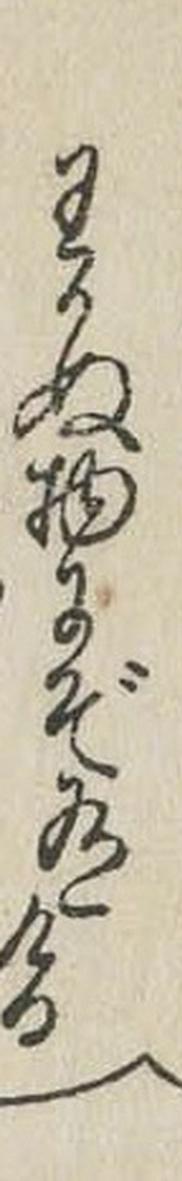わかぬ物にぞ有ける
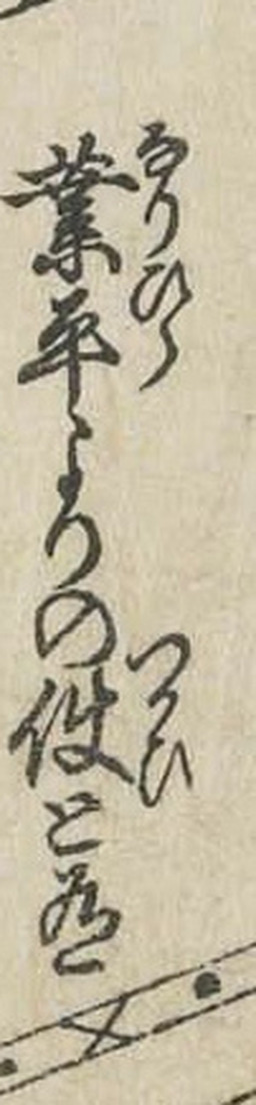業平よりの使と有
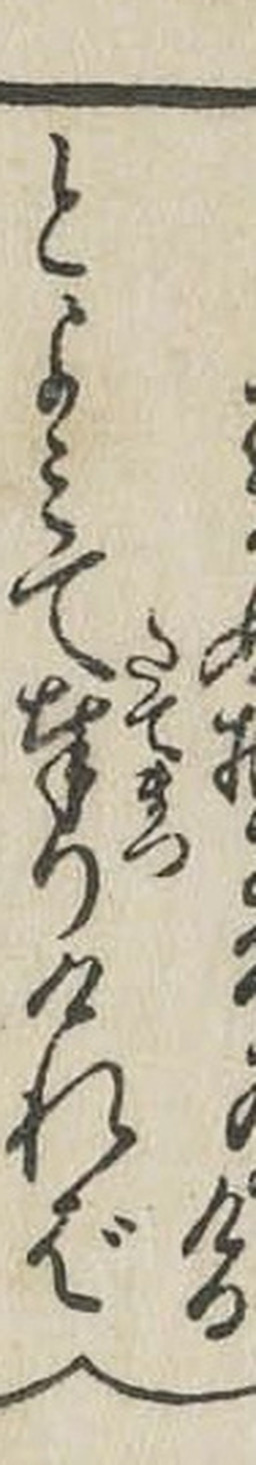とよみて奉りければ
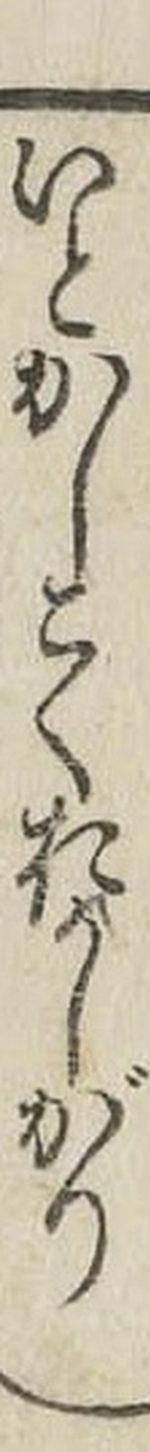いとかしこくおかしがり
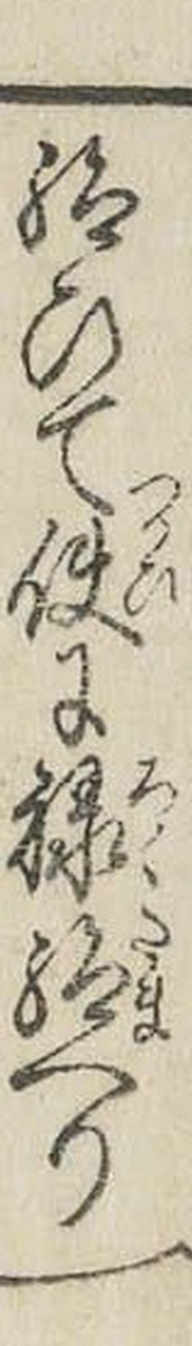給ひて使に禄給へり
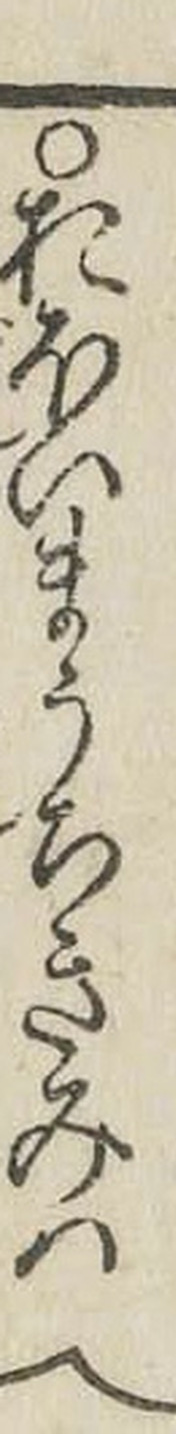◦おほいまうちきみは
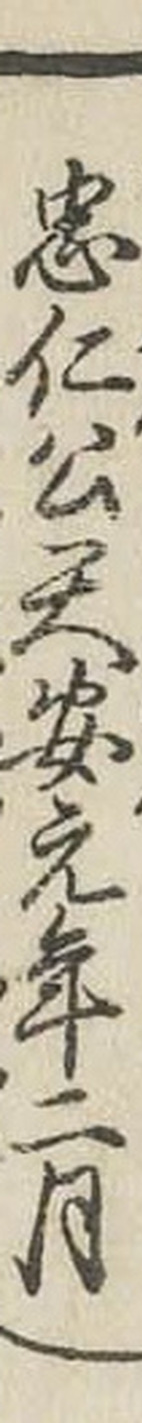忠仁公天安元年二月
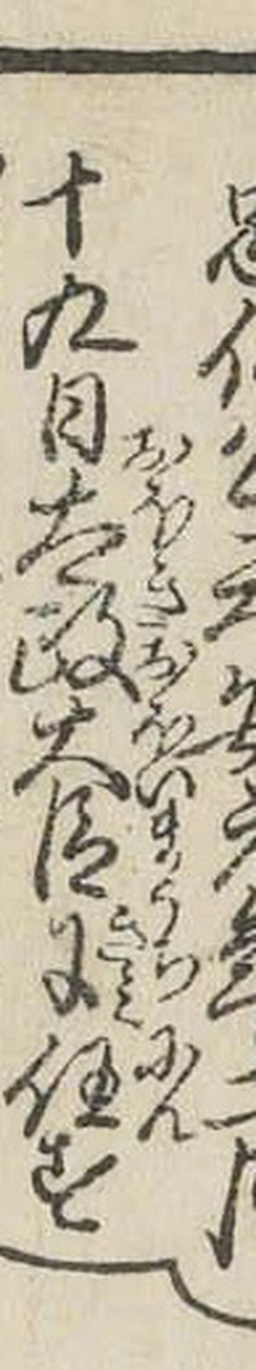十九日太政大臣に任す
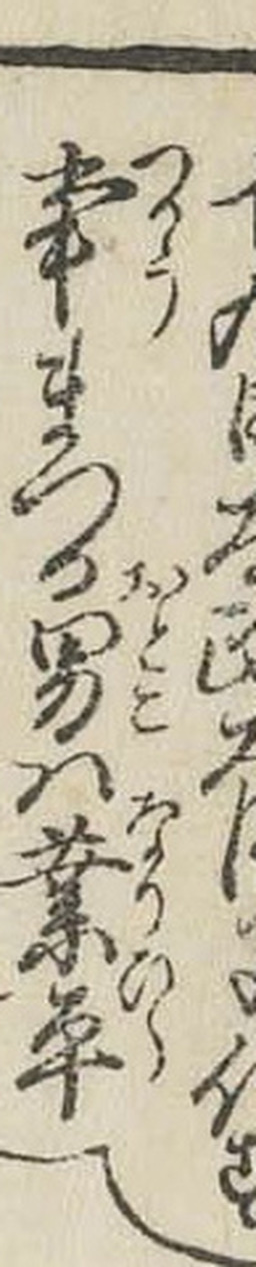事まつる男は業平
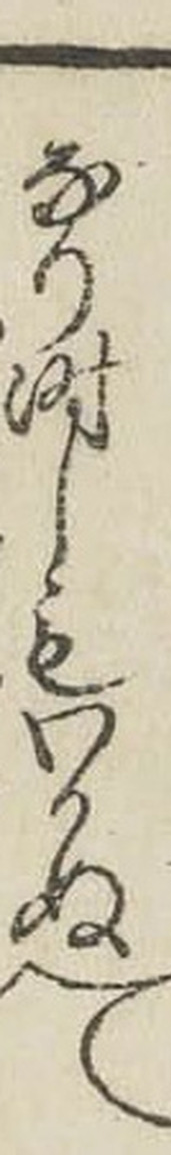なり時しもわかぬ
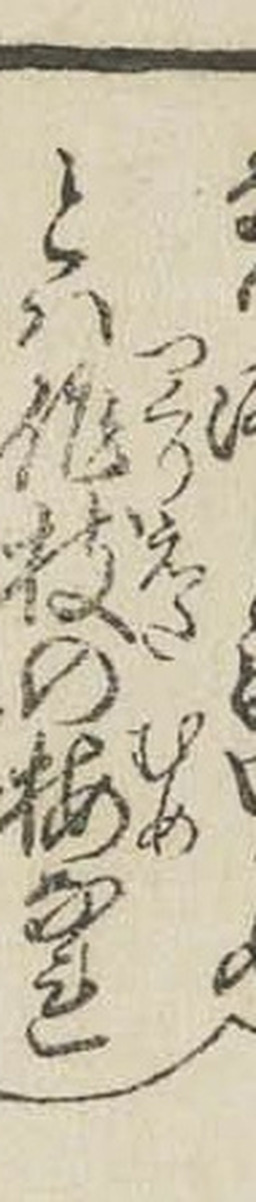とは作枝の梅なれ
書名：絵本写宝袋 9巻 1之巻
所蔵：東京学芸大学教育コンテンツアーカイブ
